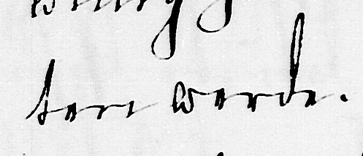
ten werde.
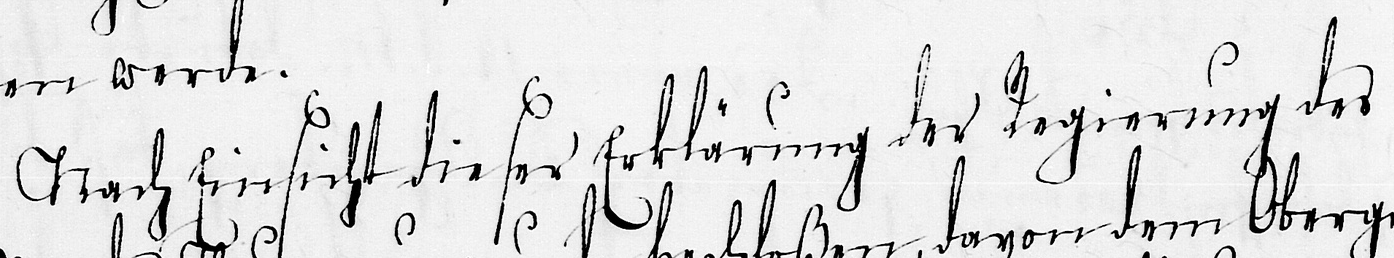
Nach Einsicht dieser Erklärung der Regierung des
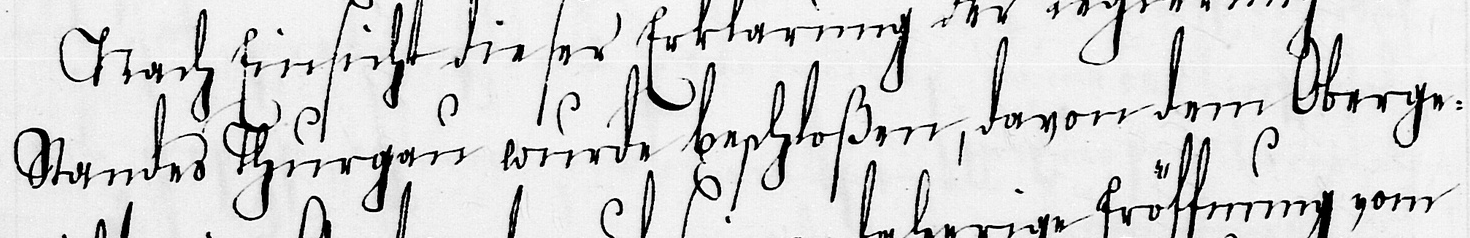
Standes Thurgau wurde beschloßen, davon dem Oberge¬
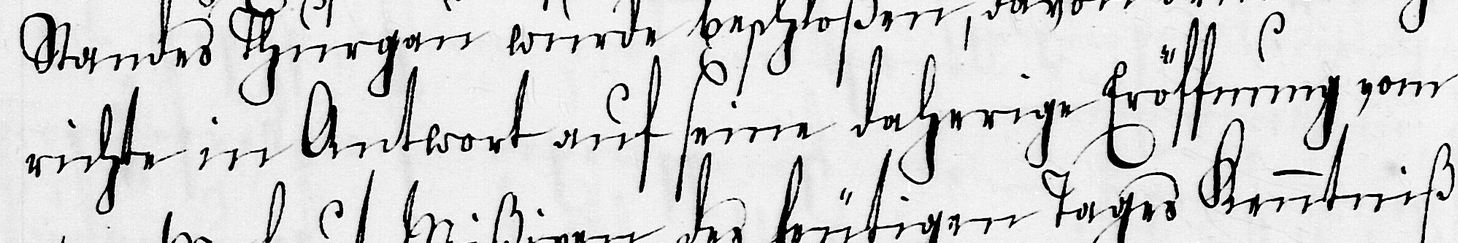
richte in Antwort auf seine daherige Eröffnung vom
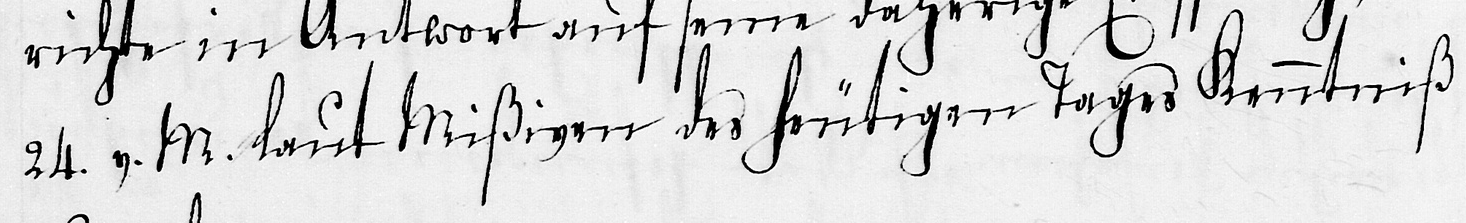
24. v. M. laut Mißiven des heutigen Tages Kenntniß
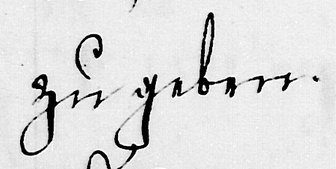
zu geben.
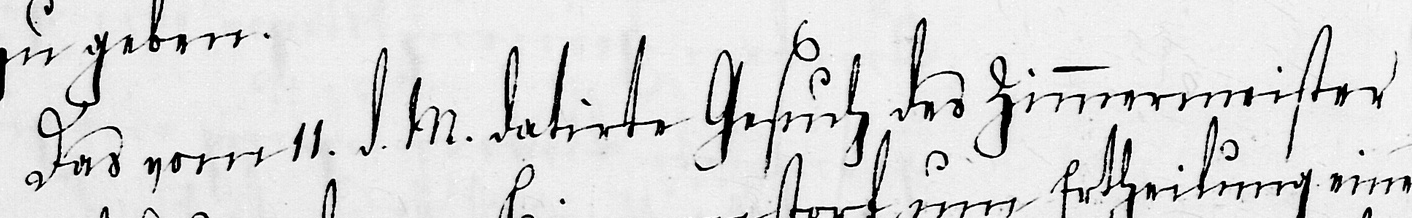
Das vom 11. d. M. datirte Gesuch des Zimmermeister
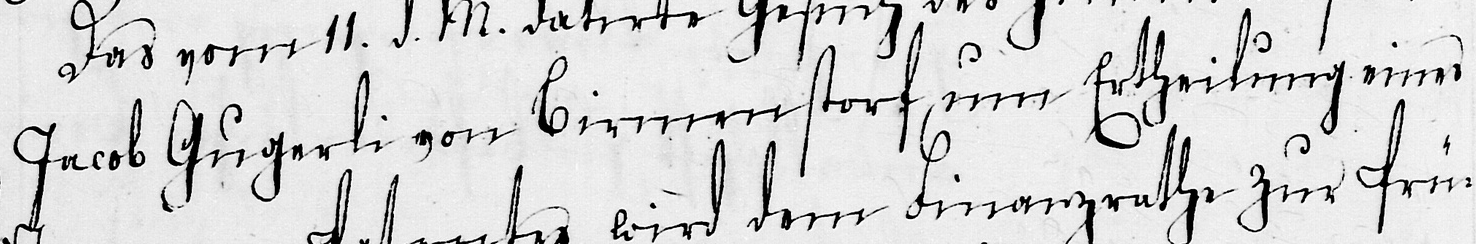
Jacob Gugerli von Birmenstorf um Ertheilung eines
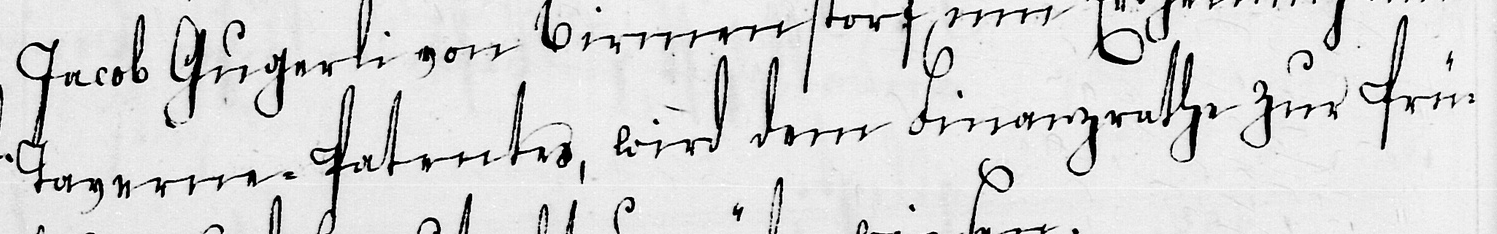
Taverne-Patentes, wird dem Finanzrathe zur Prü¬
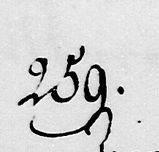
16. d.
